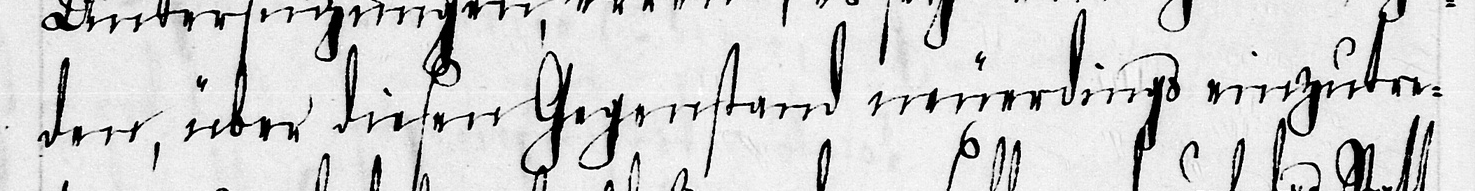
den, über diesen Gegenstand neuerdings einzutre¬
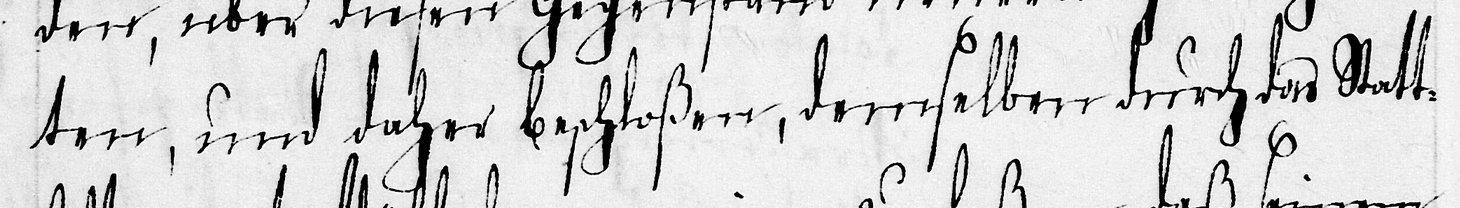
ten, und daher beschloßen, demselben durch das Stat¬
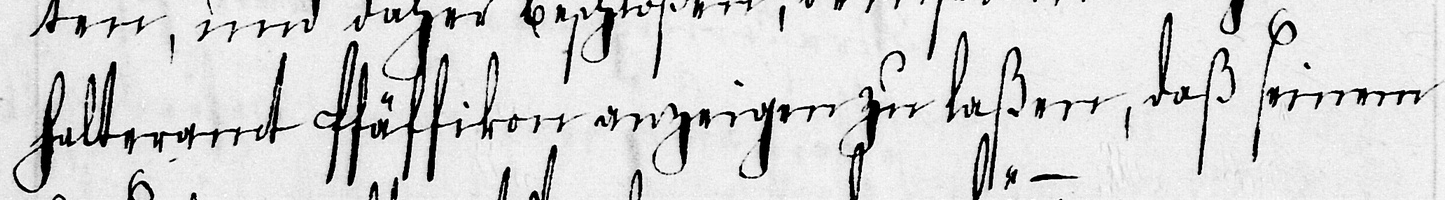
thalteramt Pfäffikon anzeigen zu laßen, das seinem
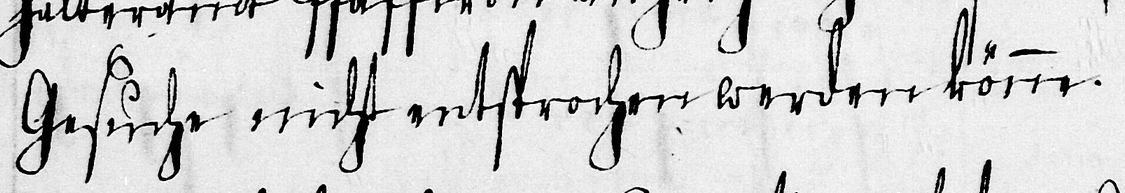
Gesuche nicht entsprochen werden könne.
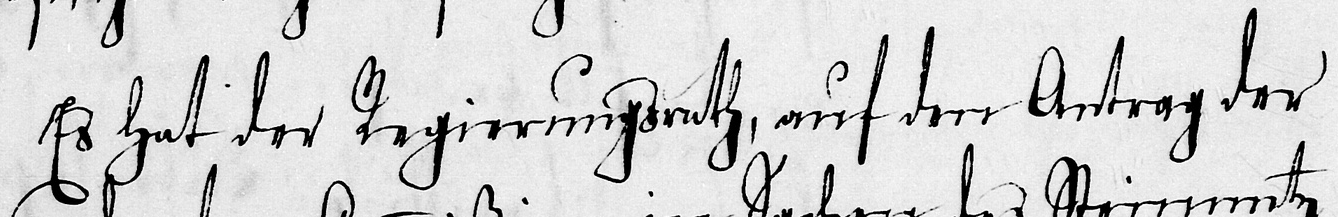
Es hat der Regierungsrath, auf den Antrag der
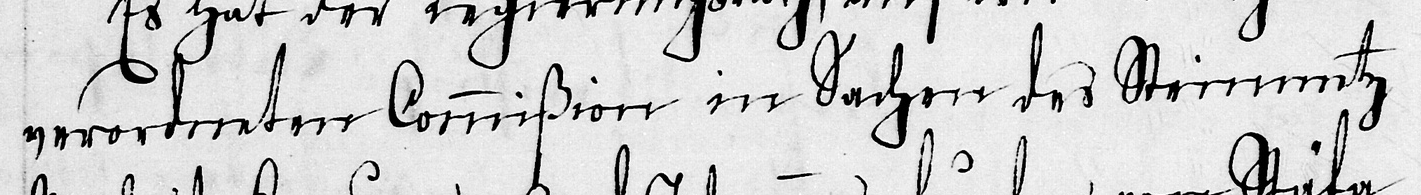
verordneten Commißion in Sachen des Steinmetz
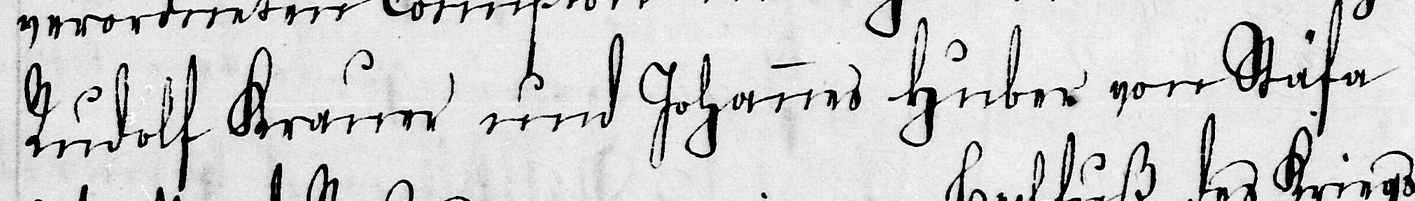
Rudolf Krauer und Johannes Huber von Stäfa
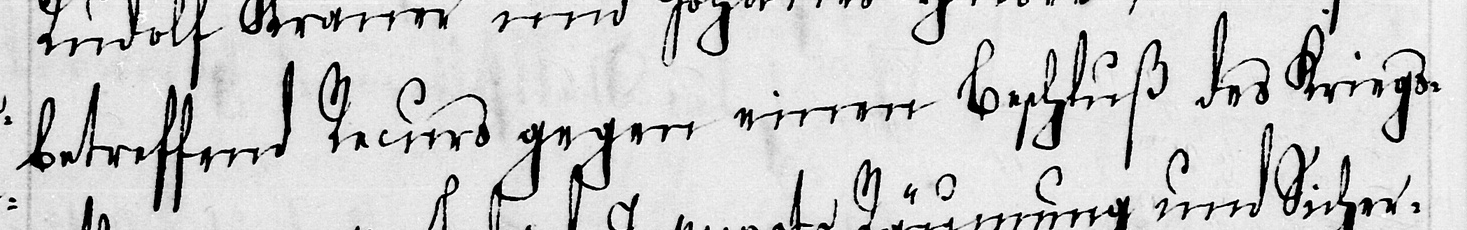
betreffend Recurs gegen einen Beschluß des Kriegs¬
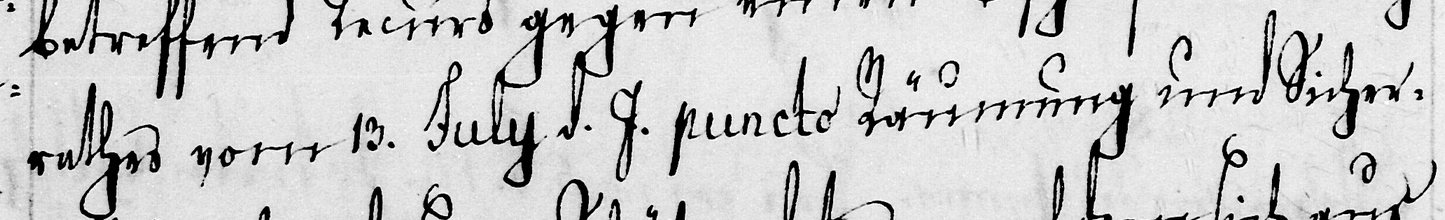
rathes vom 13. July d. J. puncto Räumung und Sicher¬
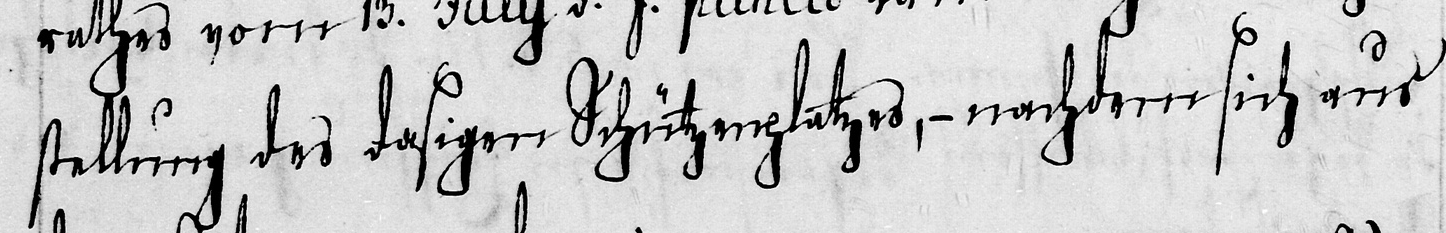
stellung des dasigen Schützenplatzes, – nachdem sich aus
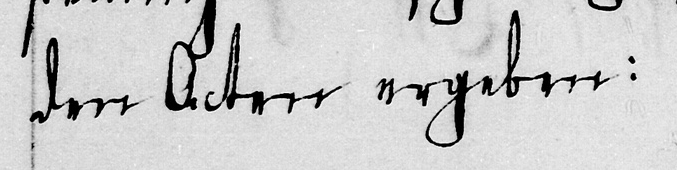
den Acten ergeben:
